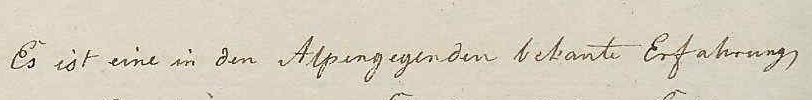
Es ist eine in den Alpengegenden bekante Erfahrung,
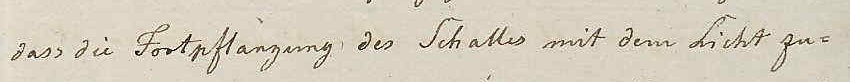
dass die Fortpflanzung des Schalles mit dem Licht zu-
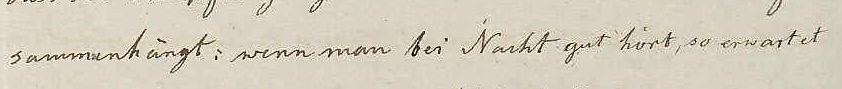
sammenhängt: wenn man bei Nacht gut hört, so erwartet
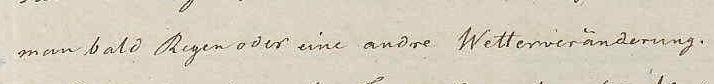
man bald Regen oder eine andre Wetterveränderung.
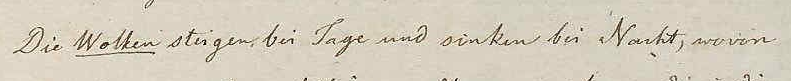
Die Wolken steigen bei Tage und sinken bei Nacht, wovon
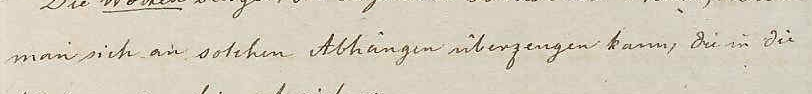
man sich an solchen Abhängen überzeugen kann, die in die
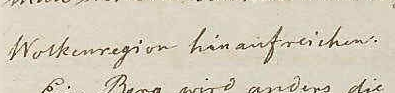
Wolkenregion hinaufreichen.
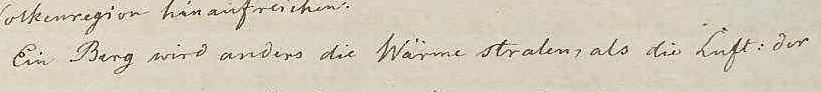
Ein Berg wird anders die Wärme stralen, als die Luft: der
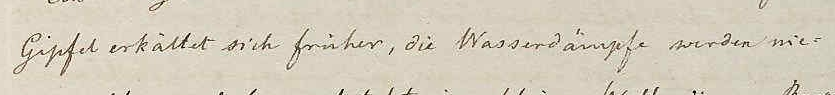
Gipfel erkältet sich früher, die Wasserdämpfe werden nie-
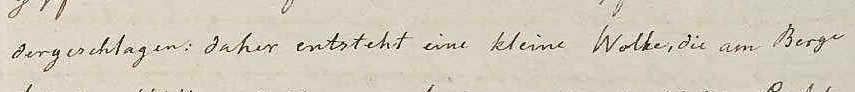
dergeschlagen: daher entsteht eine kleine Wolke, die am Berge
